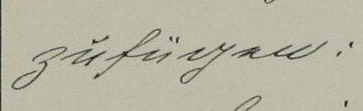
zufügen:
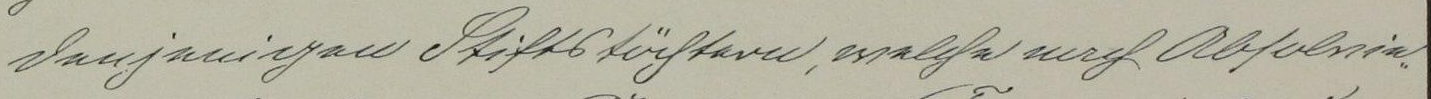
denjenigen Stiftstöchtern, welche nach Absolvie-
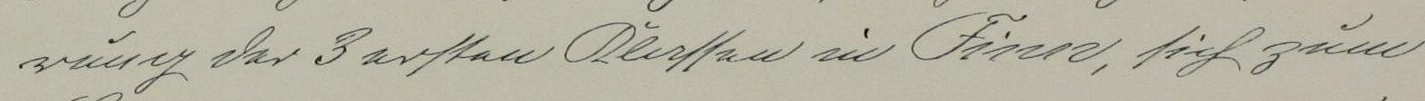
rung der 3 ersten Klassen in Finn, sich zum
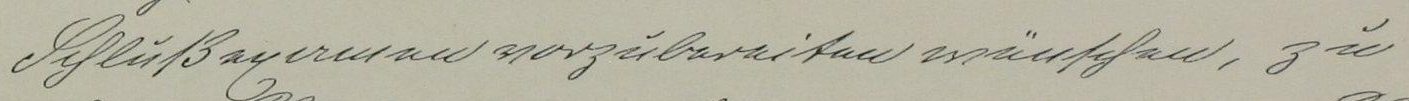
Schlußexamen vorzubereiten wünschen, zu
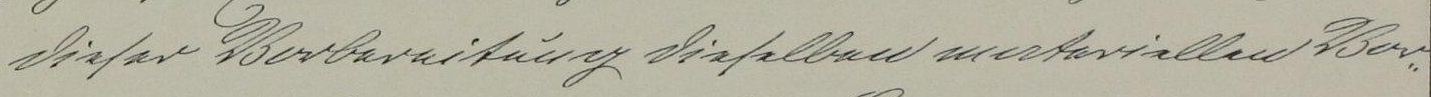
dieser Vorbereitung dieselben materiellen Vor-
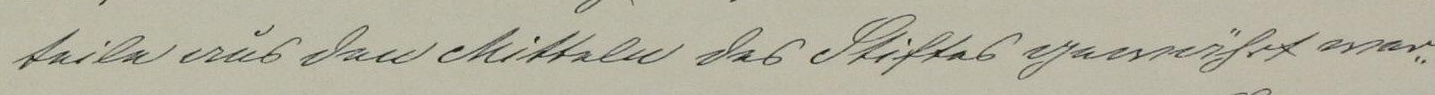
teile aus den Mitteln des Stiftes gewährt wer-
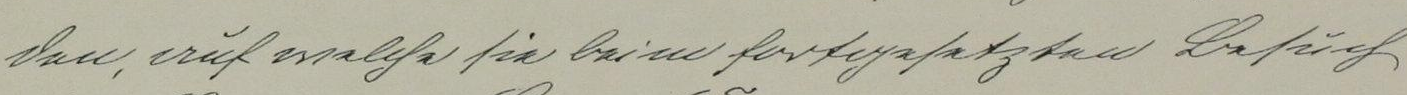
den, auf welche sie beim fortgesetzten Besuch
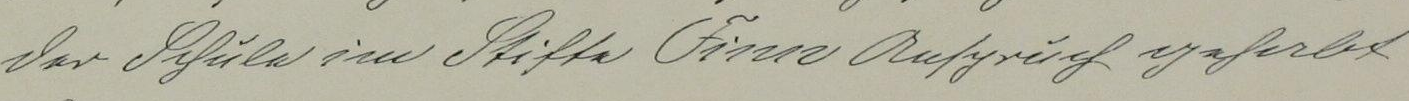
der Schule im Stifte Finn Anspruch gehabt
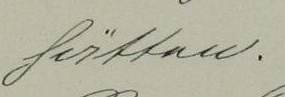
hätten.
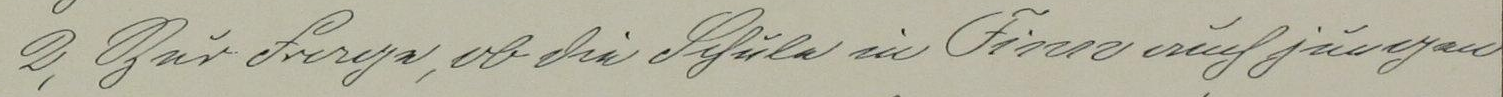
2. Zur Frage, ob die Schule in Finn auch jungen
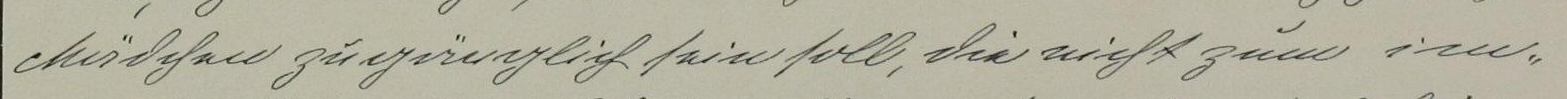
Mädchen zugänglich sein soll, die nicht zum im-
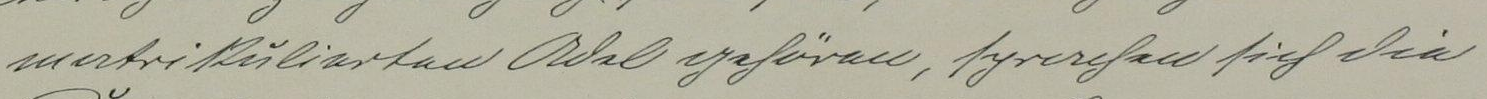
matrikulierten Adel gehören, sprachen sich die
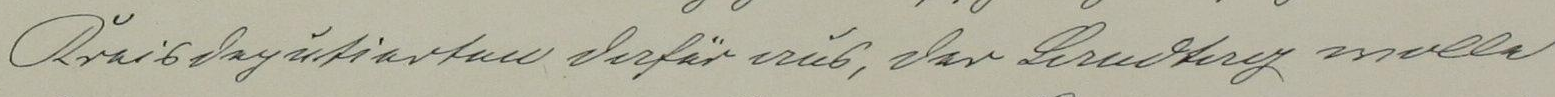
Kreisdeputierten dafür aus, der Landtag wolle
